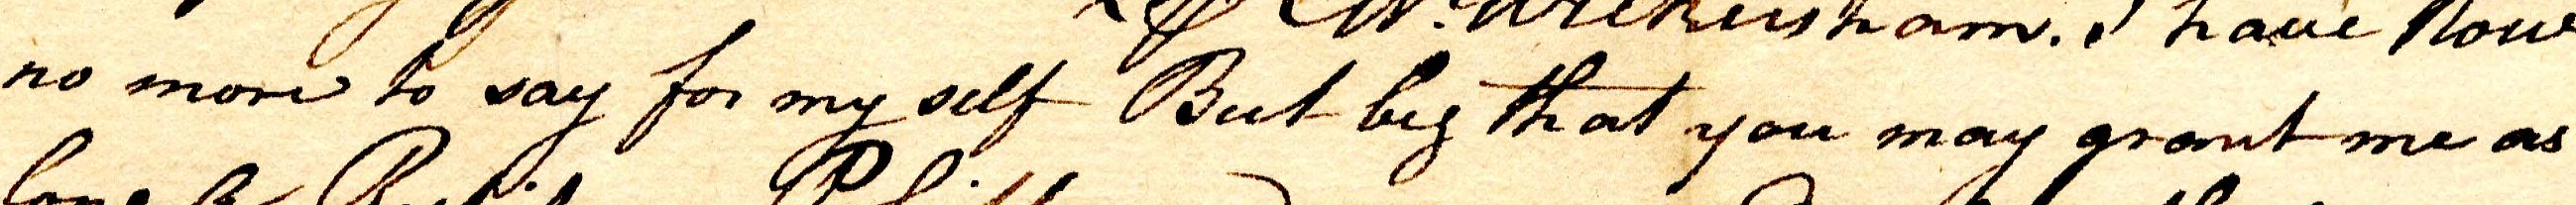no more to say for my self But beg that you may grant me as
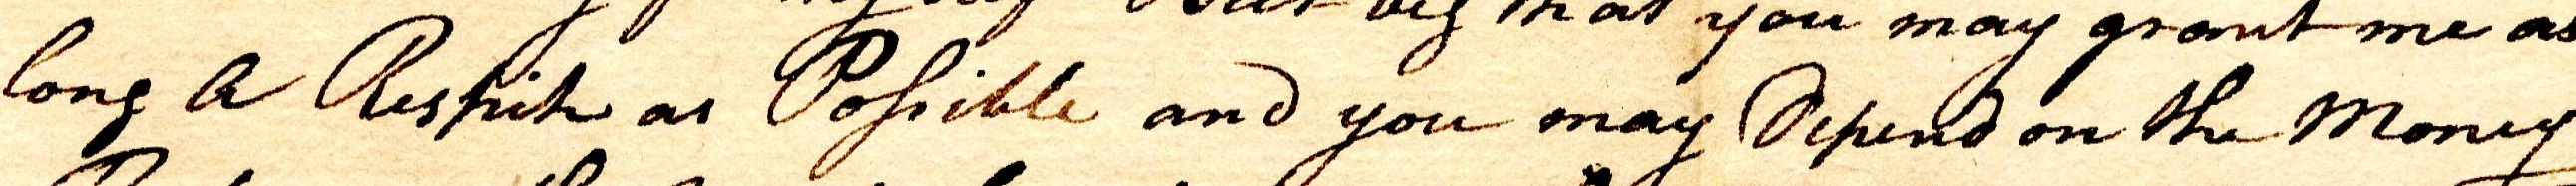long a Respite as Possible and you may depend on the Money
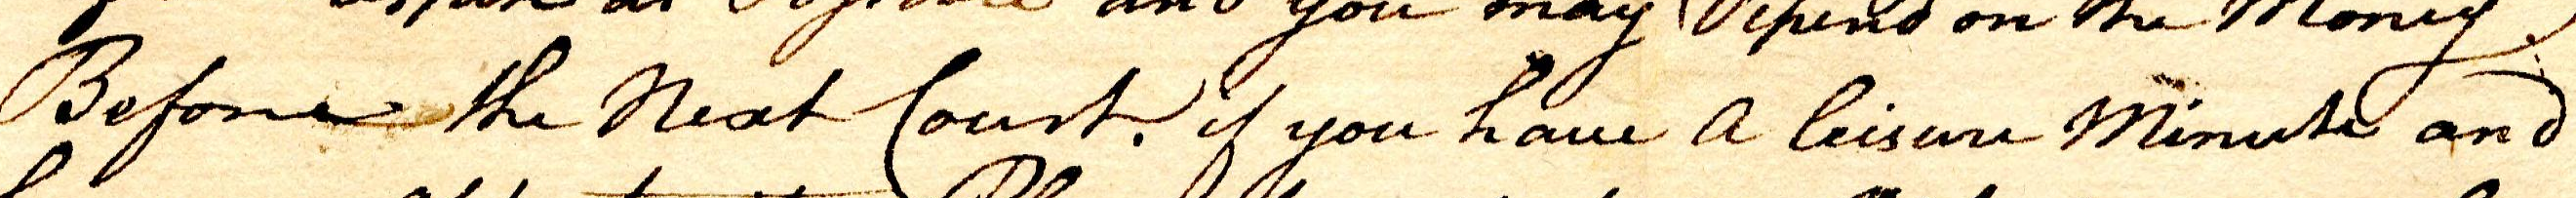Before The Next Court if you have a leisure Minute and
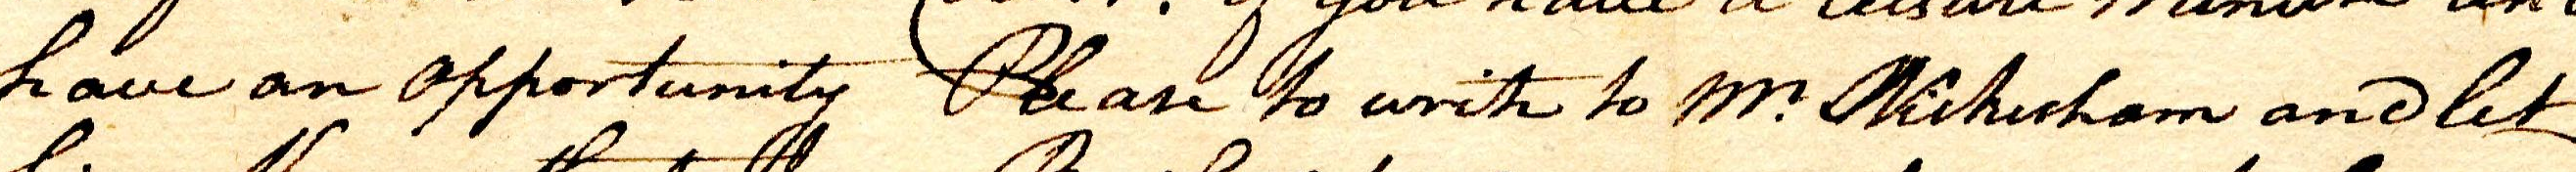have an opportunity Please to write to M^r. Wickersham and let
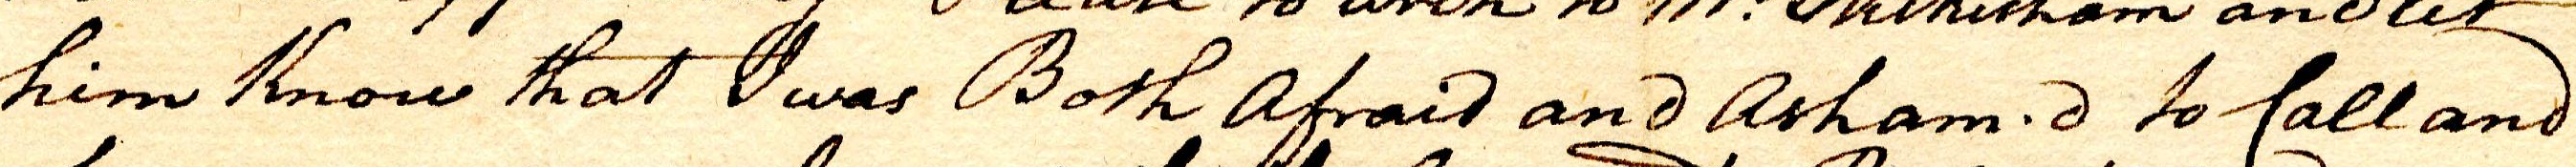him Know that I was Both Afraid and Ashamed to Call and
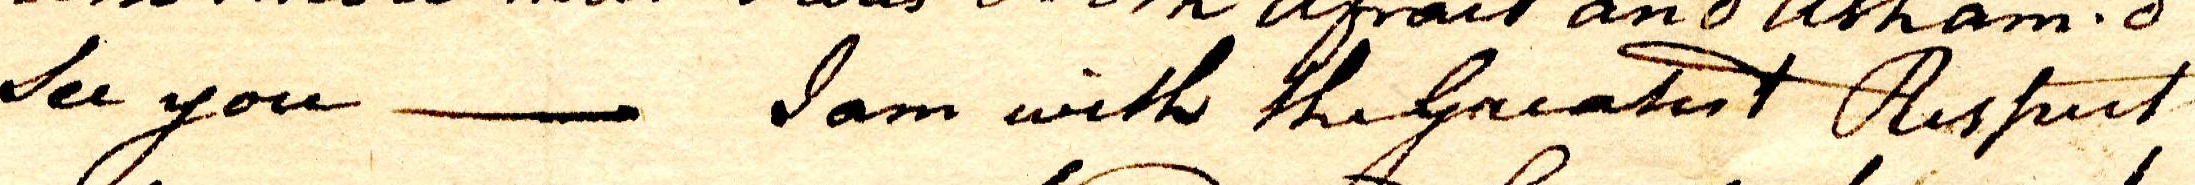see you. I am with the Greatest Respect
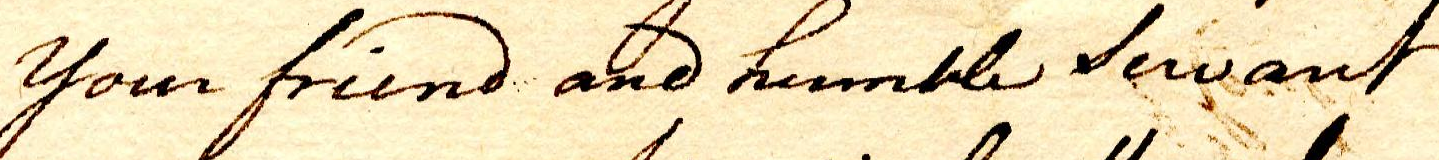Your friend and humble servarnt
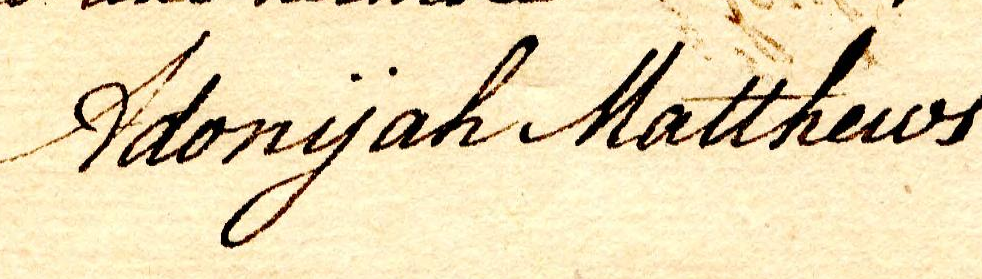Adonijah Matthews
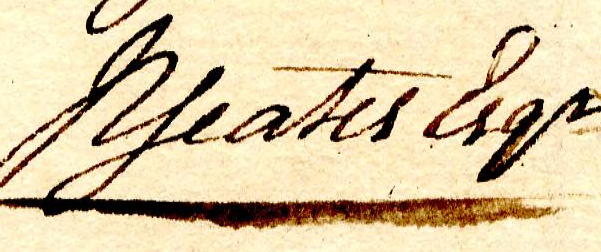J Yeates Esq
